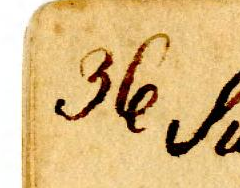36
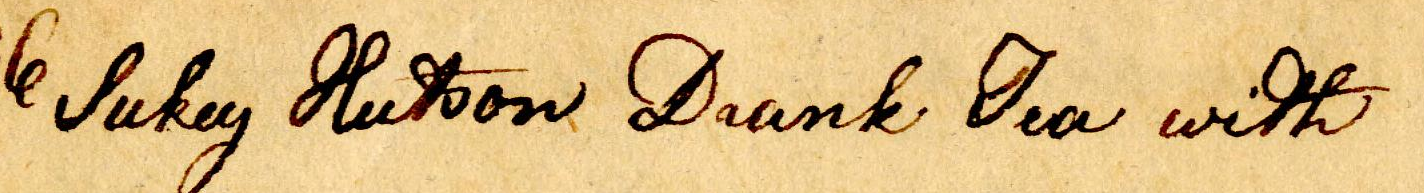Sukey Hutson Drank Tea with
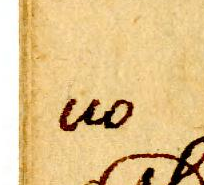us
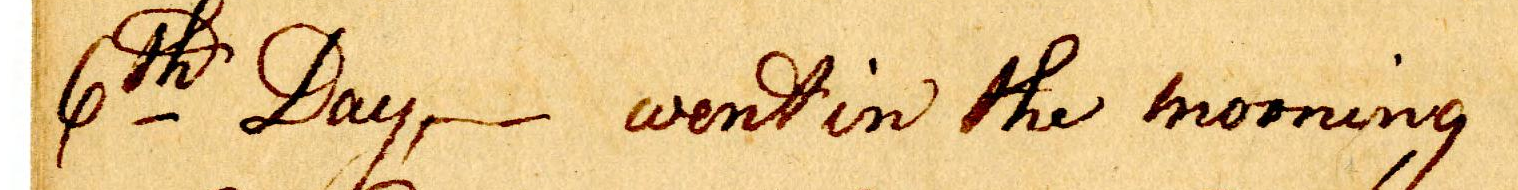6^th Day- went in the morning
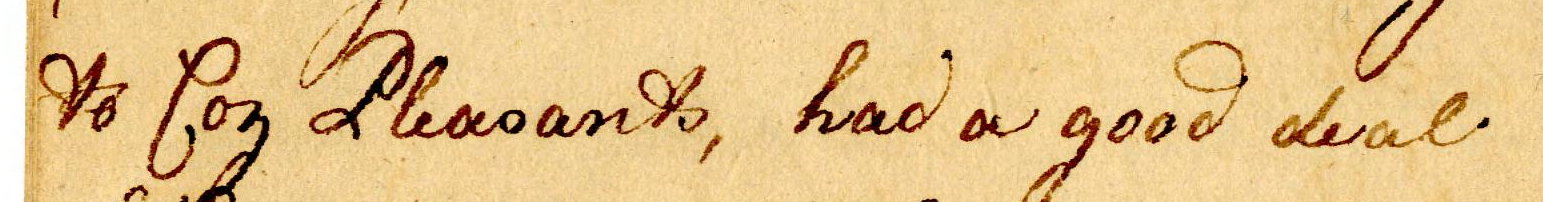to Coz Pleasants, had a good deal
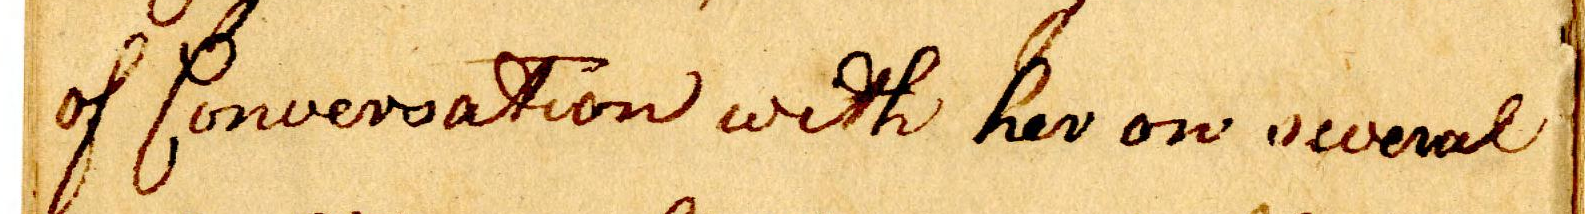of Conversation with her on several
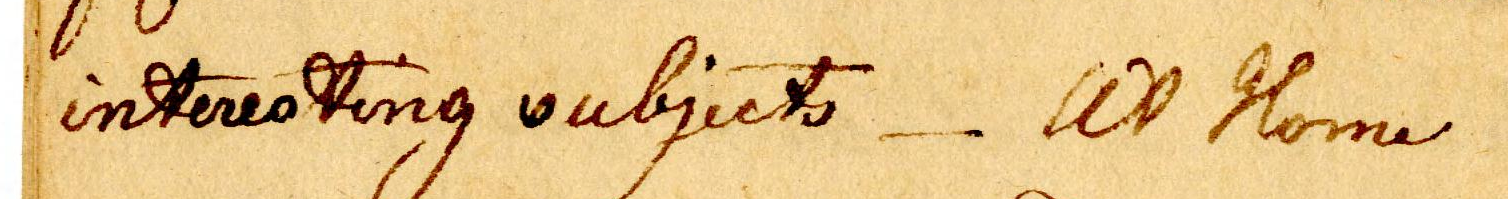interesting subjects- At Home
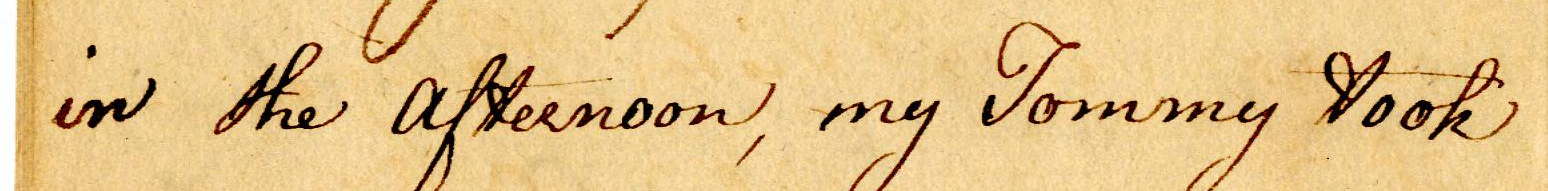in the Afternoon, my Tommy took
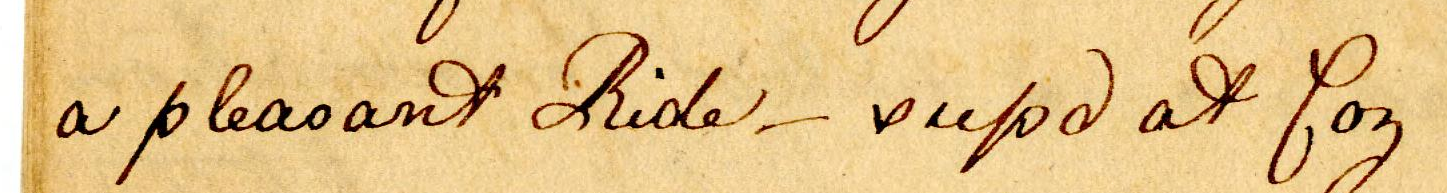a pleasant Ride- supd at Coz
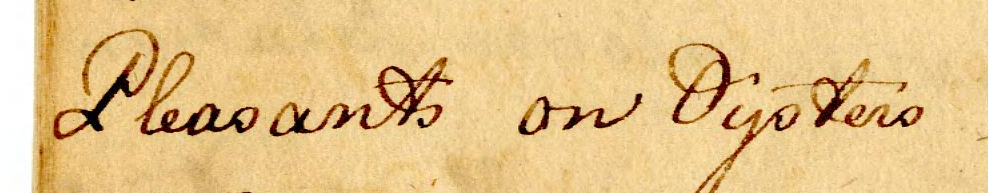Pleasants on Oysters
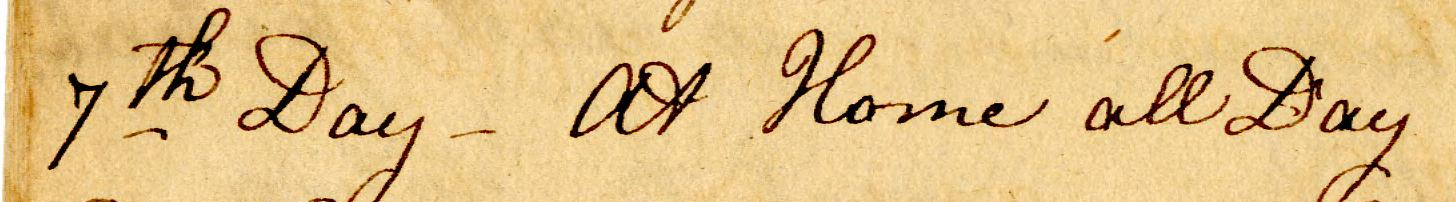7^th Day- At Home all Day
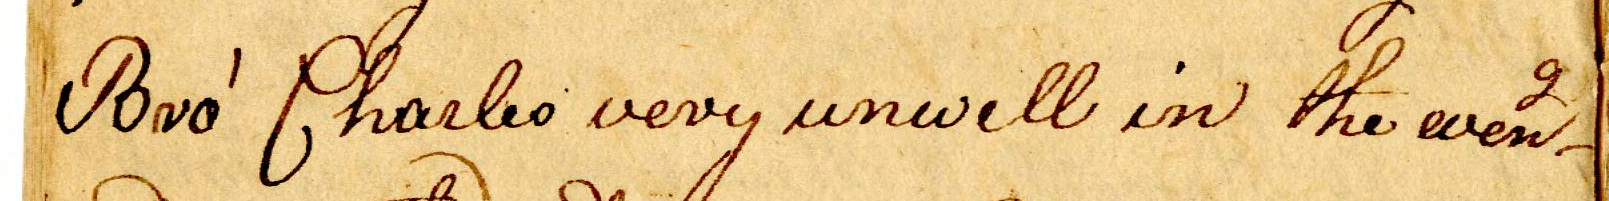Bro' Charles very unwell in the even^g
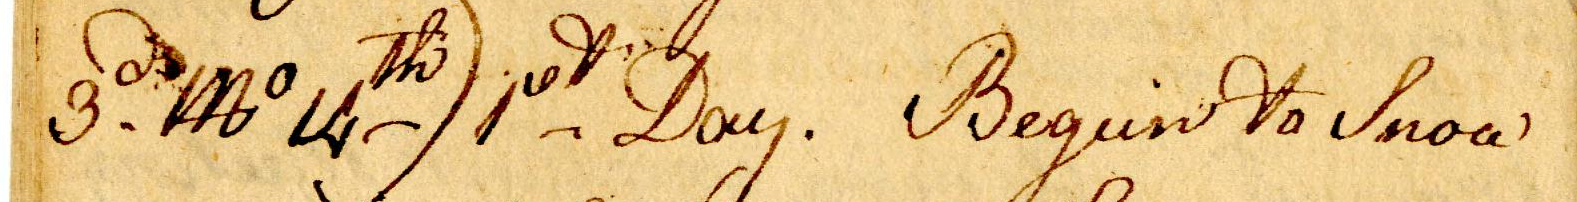3^d M^o 14^th) 1^st Day. Begun to Snow
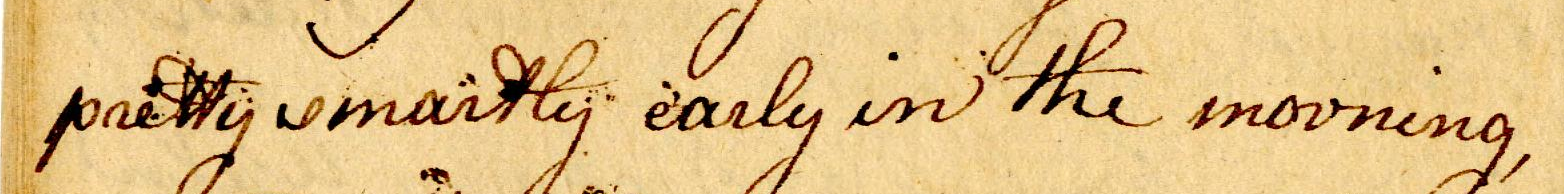pretty smartly early in the morning,
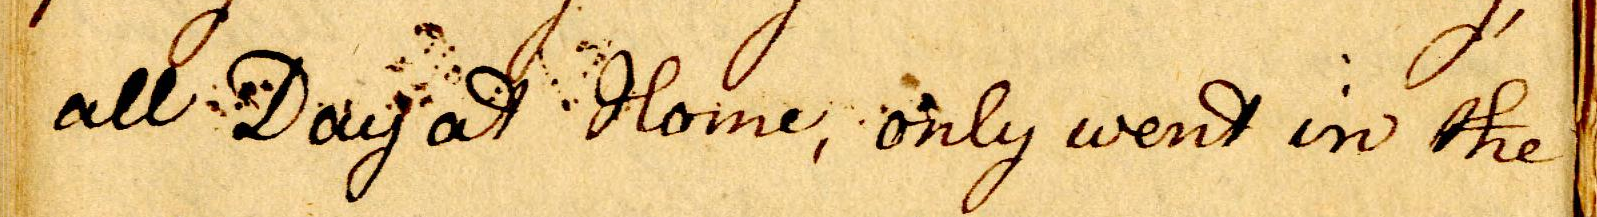all Day at Home, only went in the
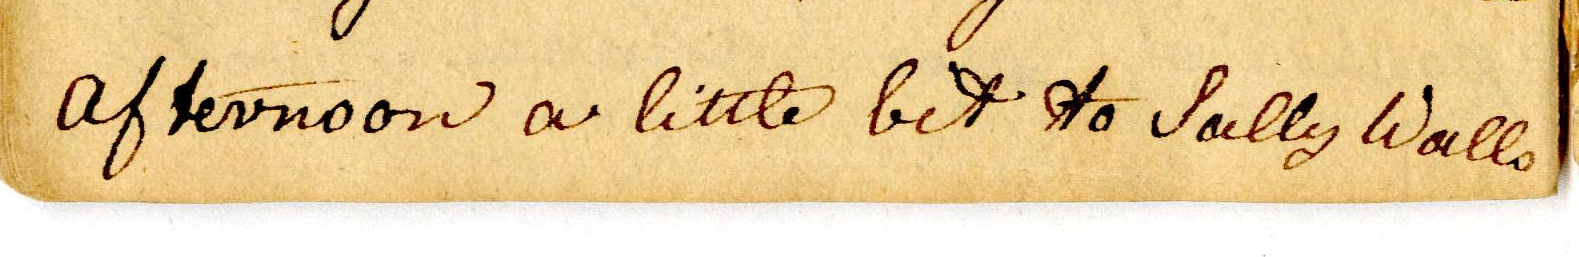Afternoon a little bit to Sally Walls
